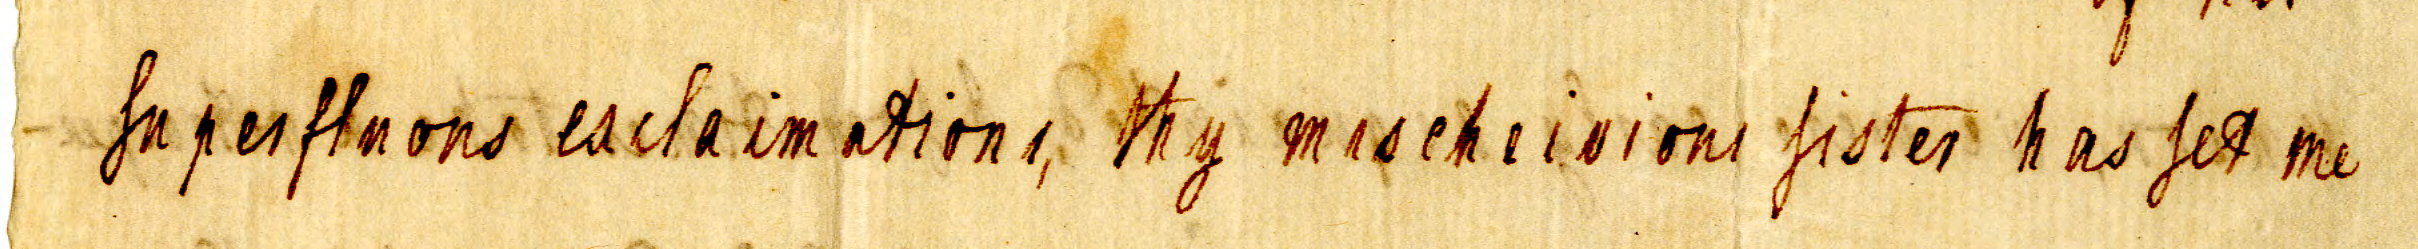superfluous exclaimations, thy mischeivious sister has set me
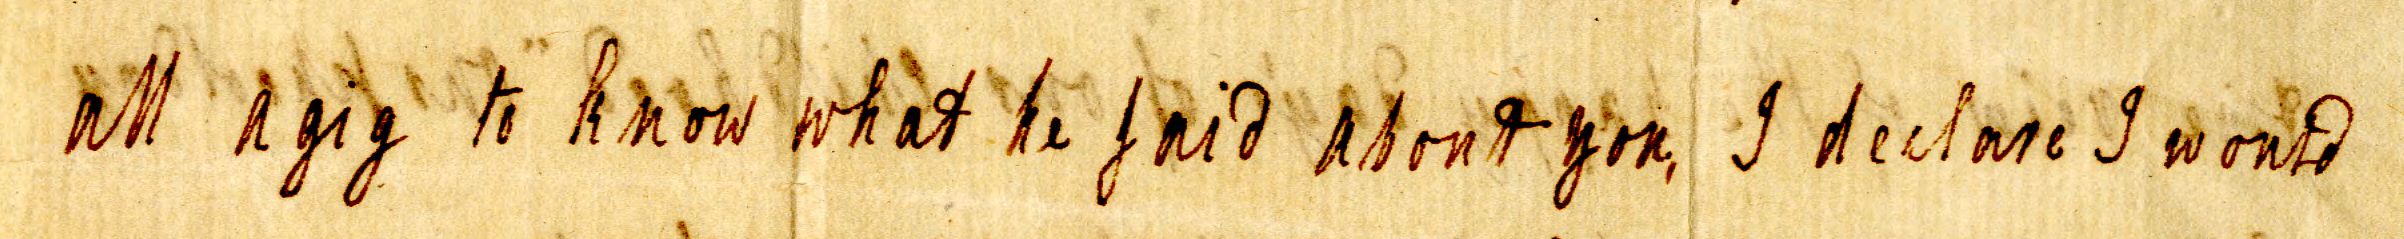all agig to know what he said about you, I declare I would
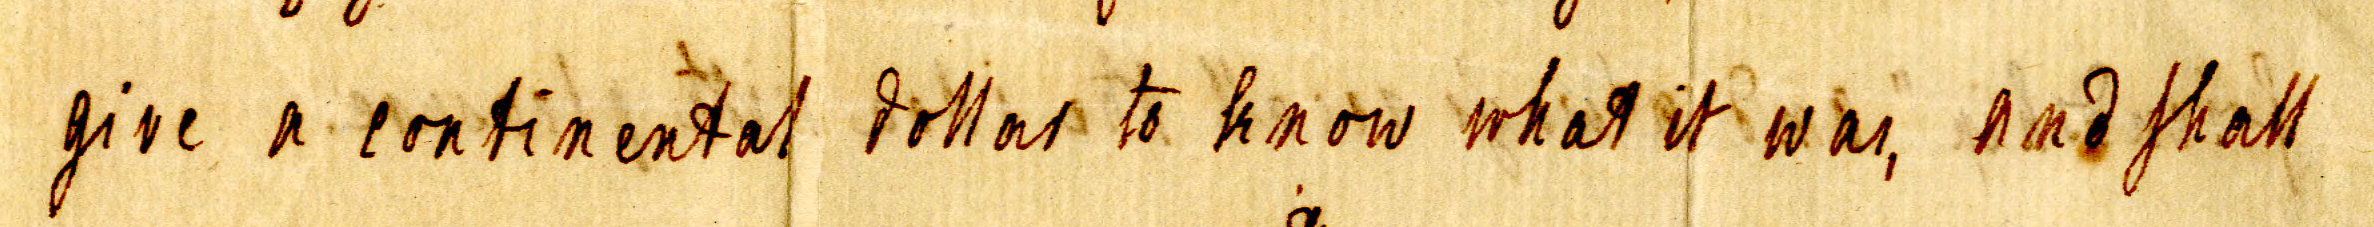give a continental dollar to know what it was, and shall
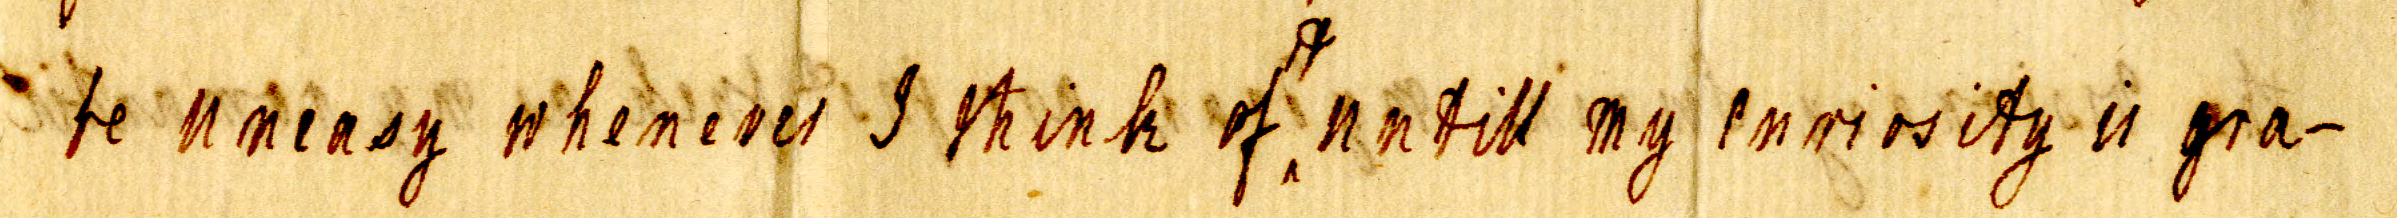be uneasy whenever I think of it until my curiosity is gra-
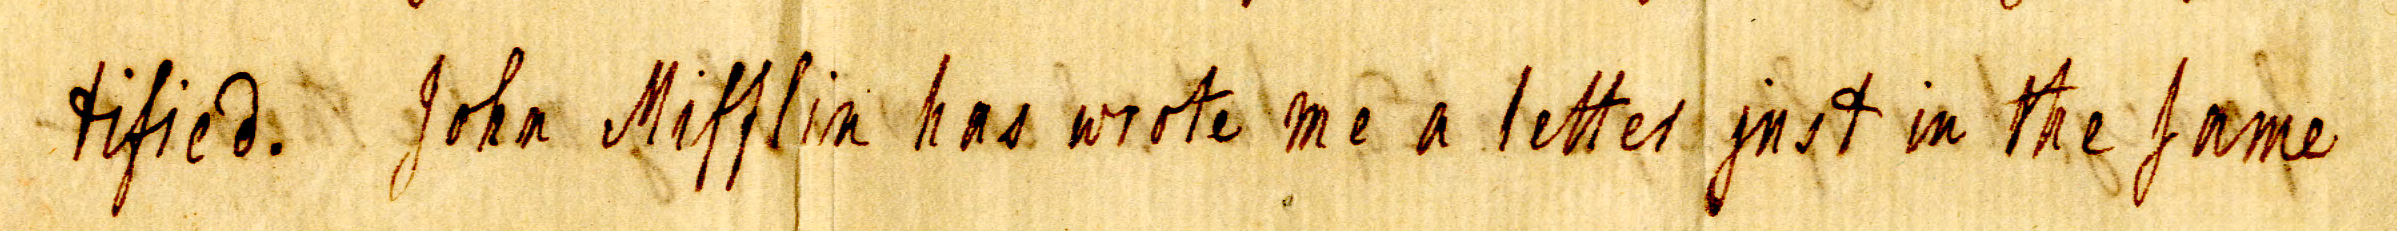tified. John Mifflin has wrote me a letter just in the same
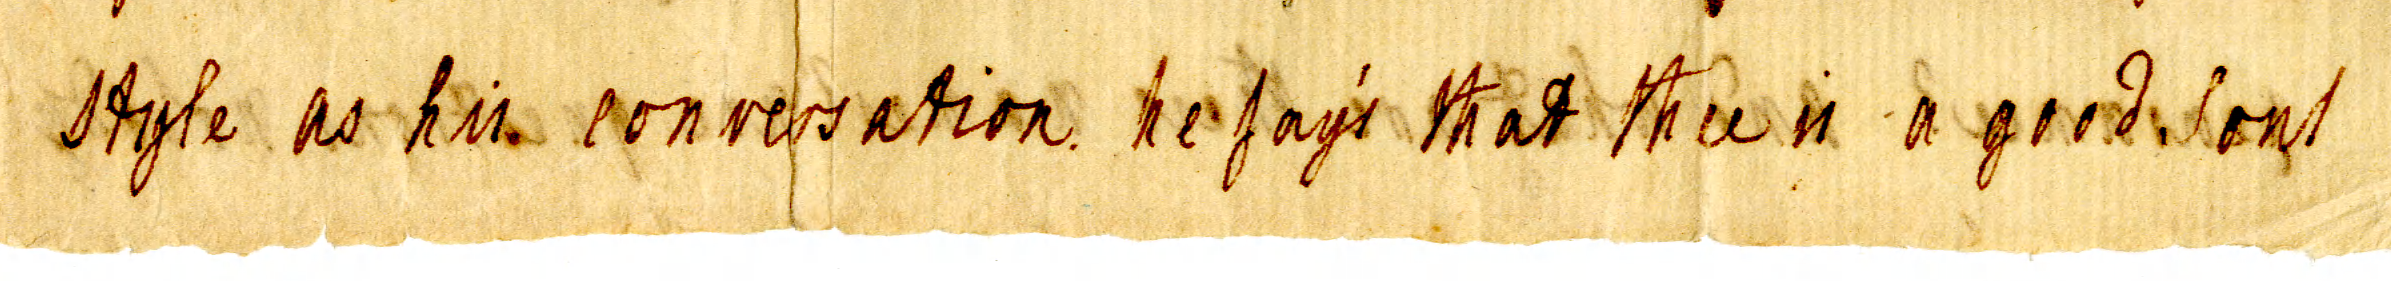style as his conversation. he say's that thee is a good sort
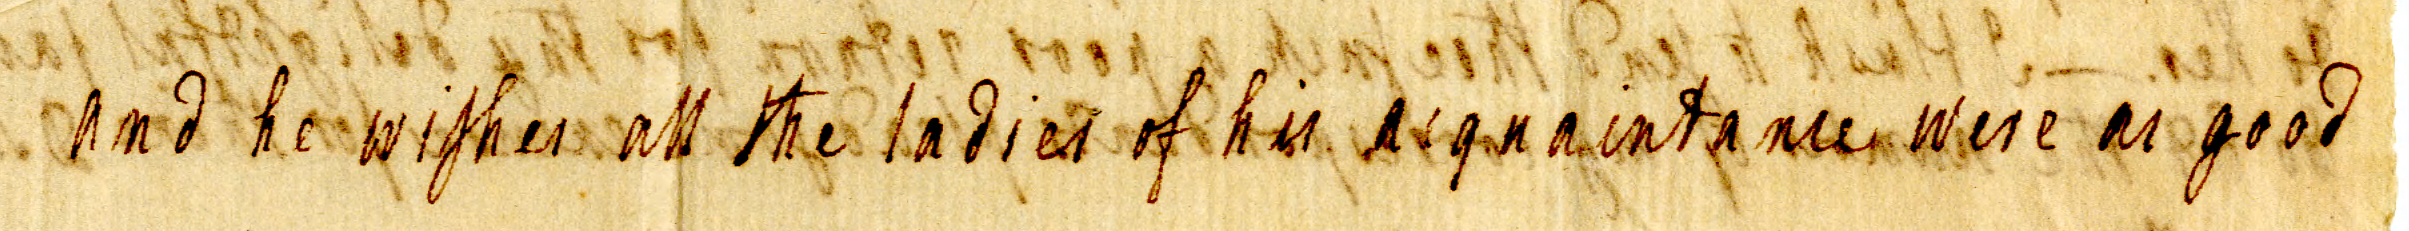and he wishes all the ladies of his acquaintance were as good
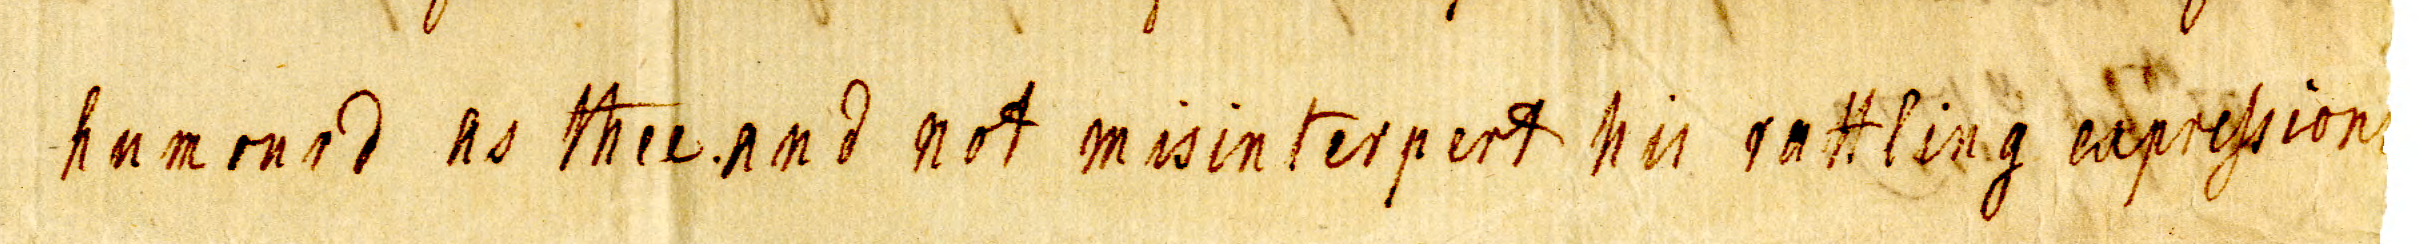humourd as thee and not misinterpret his rattling expression
